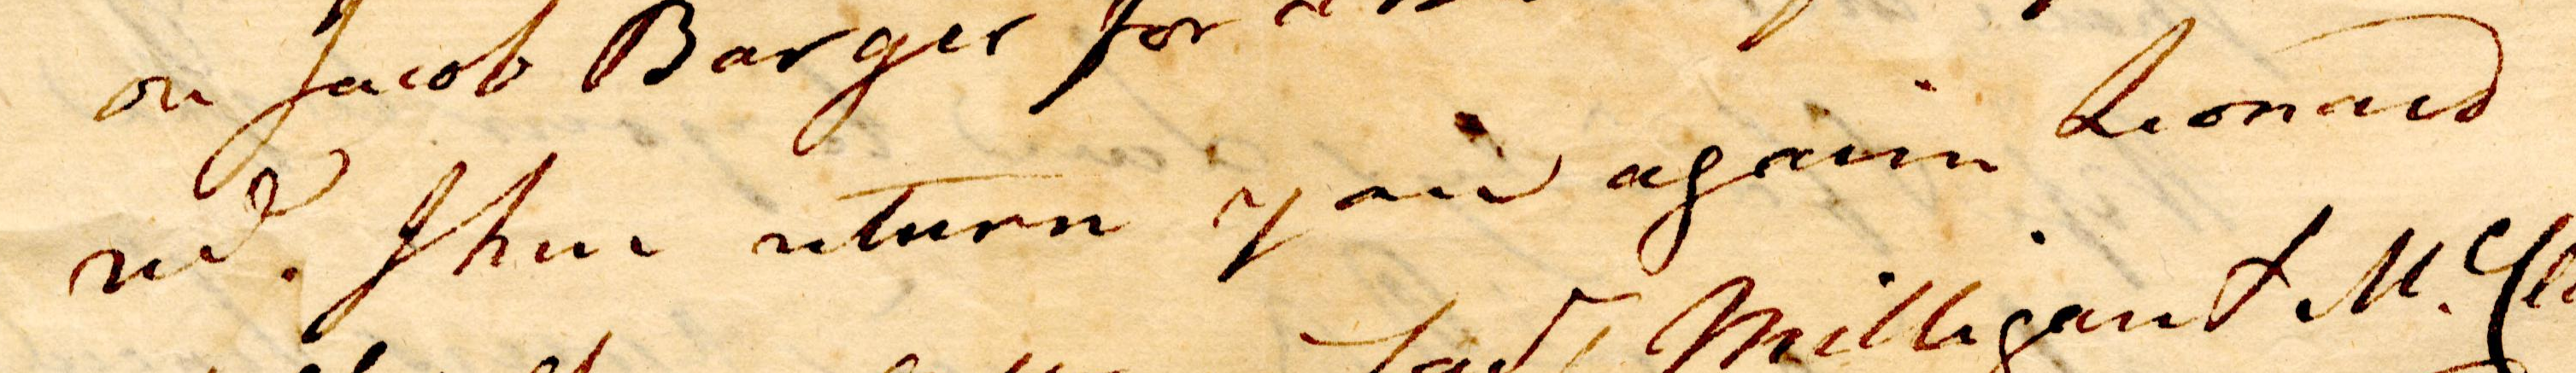rec^e. I here return you again Leonard
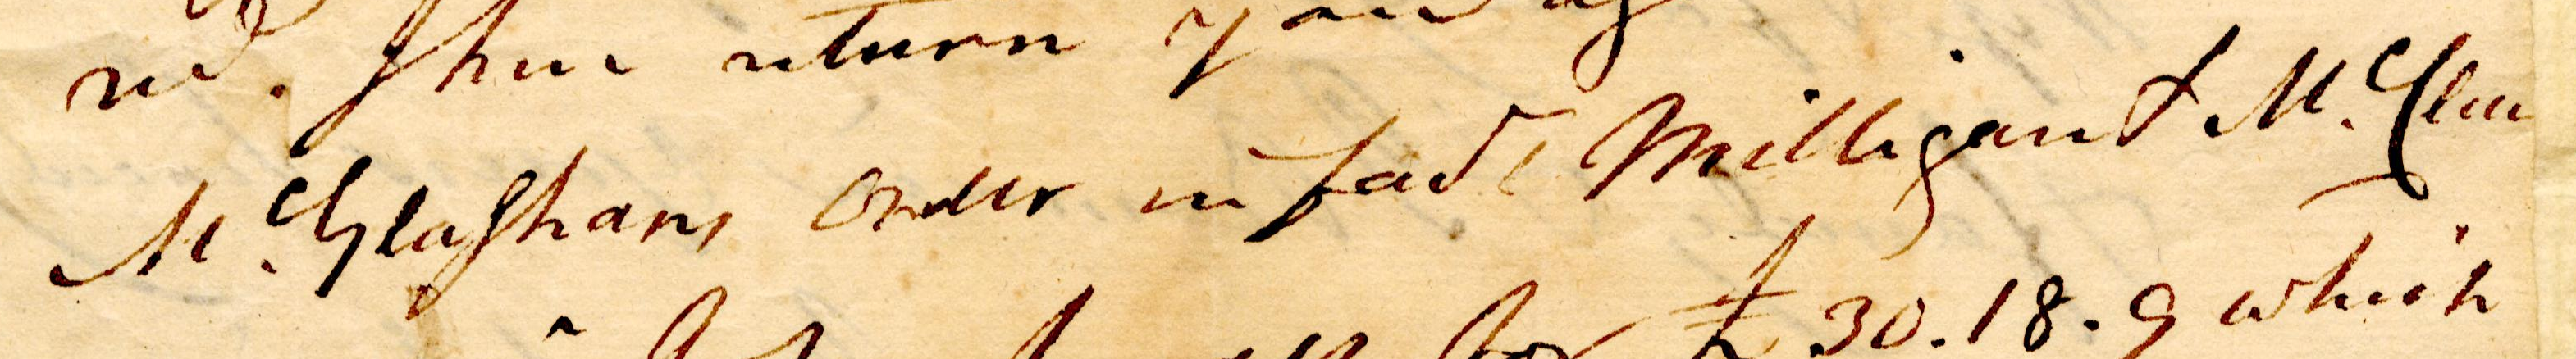M^c.Glaghans order in fav^r Milligan & M^c.Clee
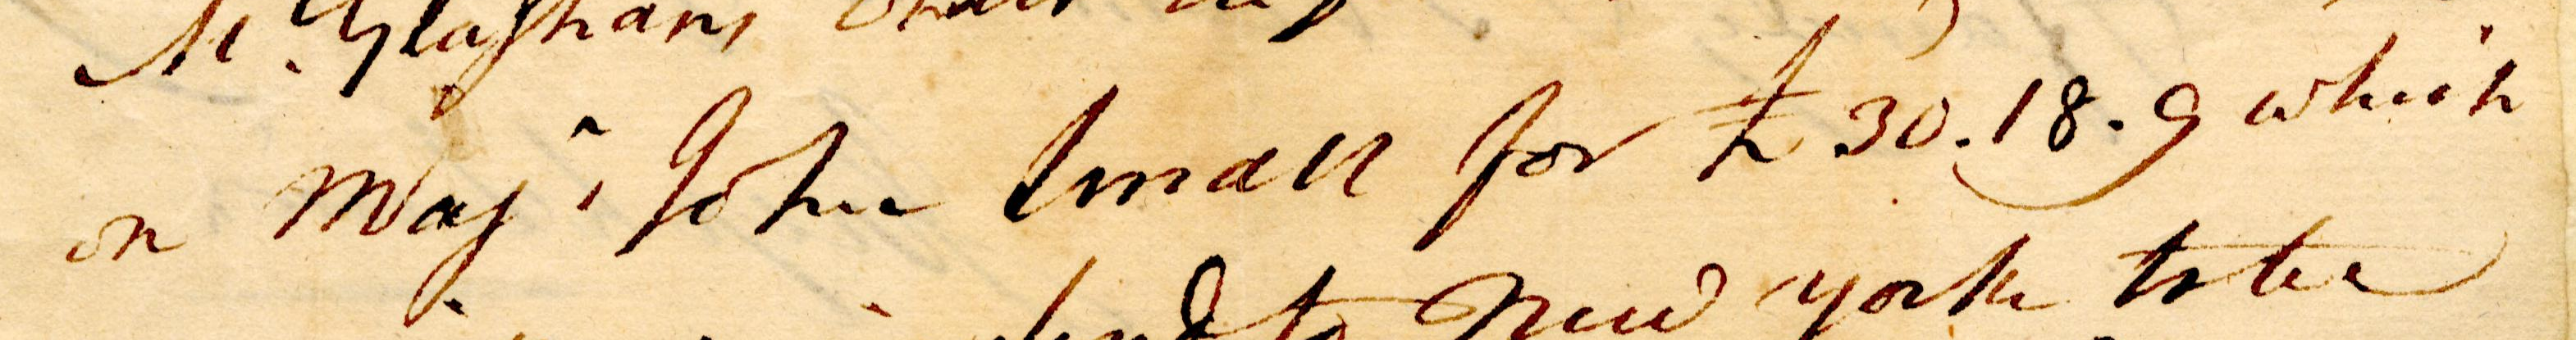on may to be small for £30.18.9 which
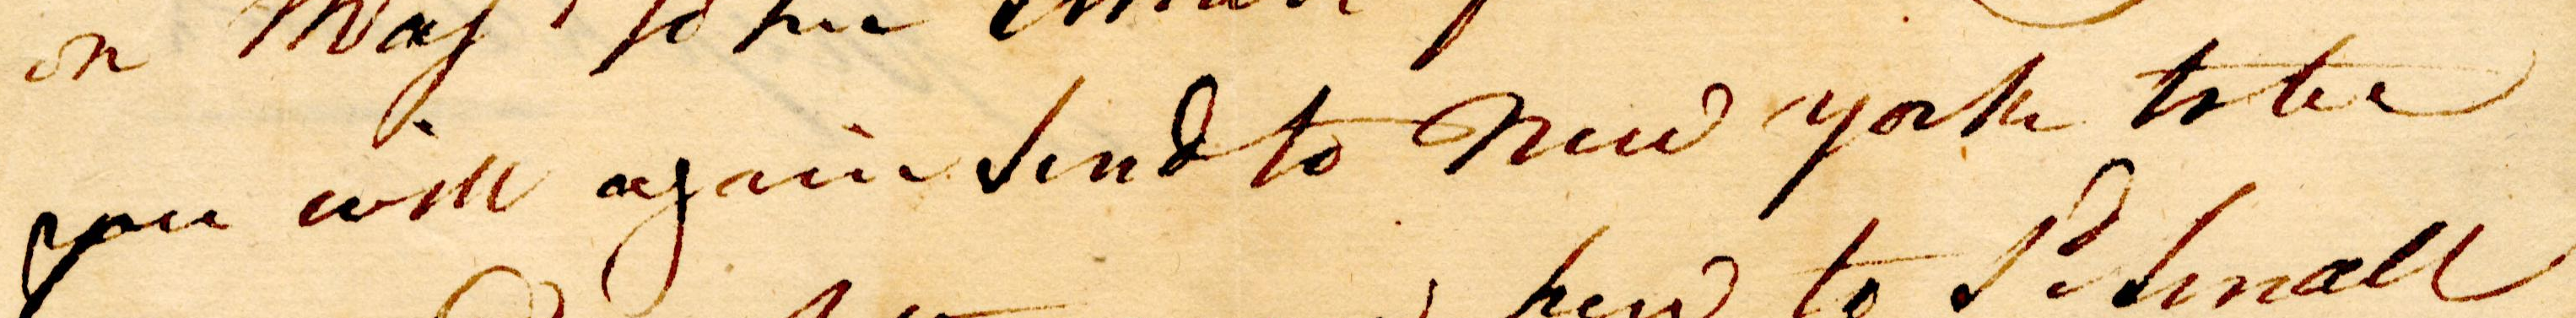you will again send to New York to be
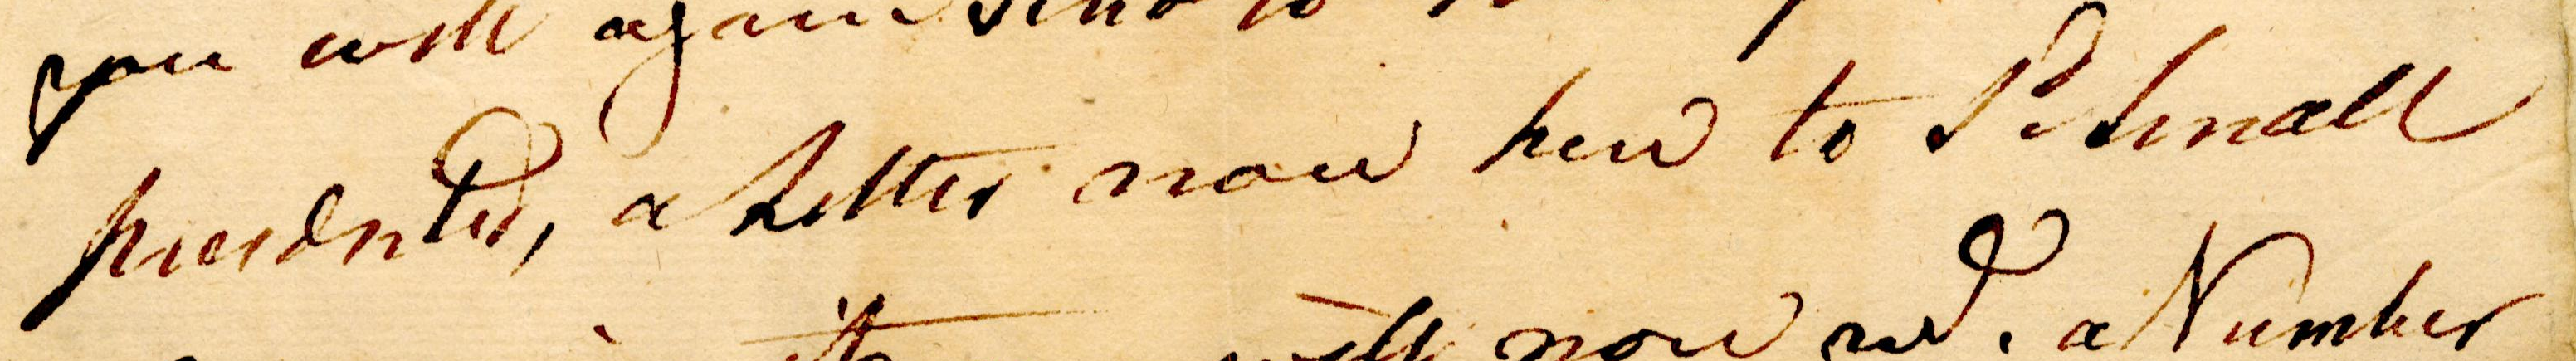presented, a Letter now here to s^d. Small
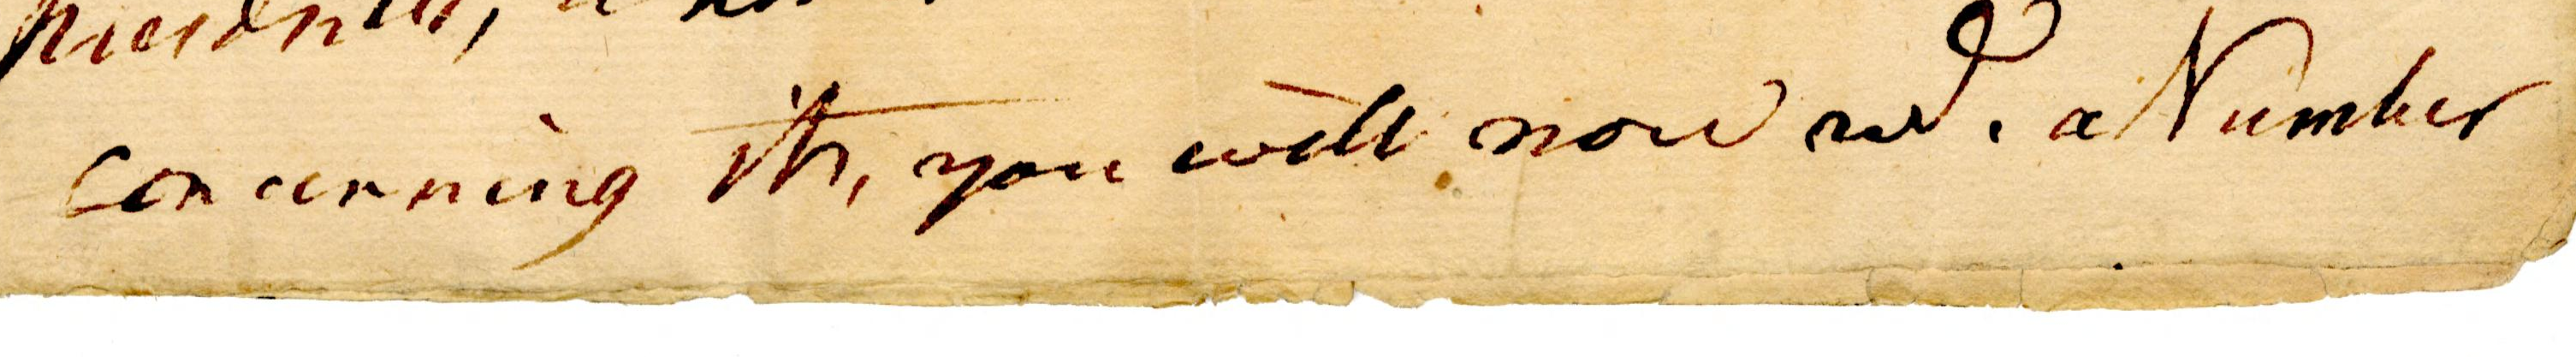concerning it, you will now rec^d. a Number
